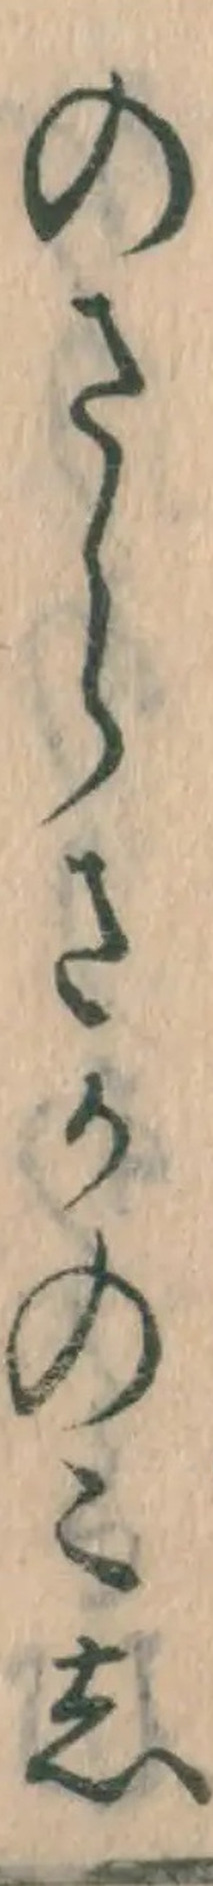のさらさかのこし

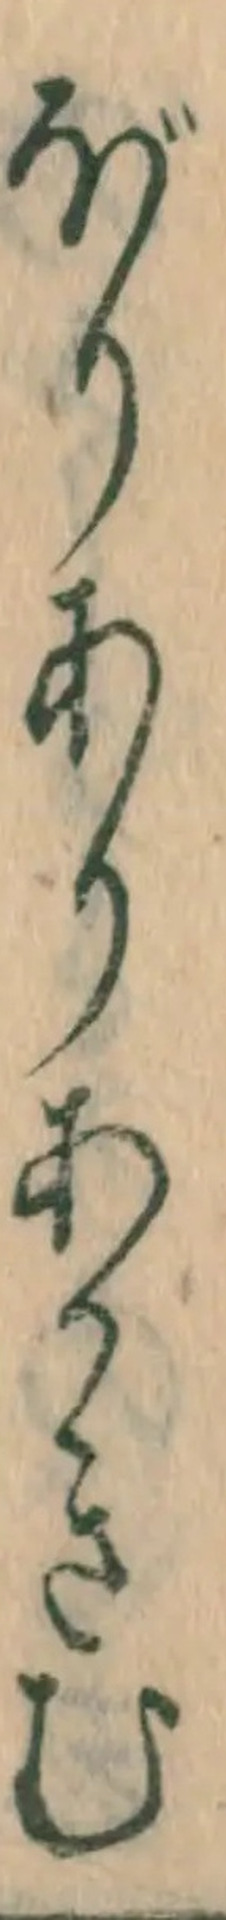ぼりありあかきむ
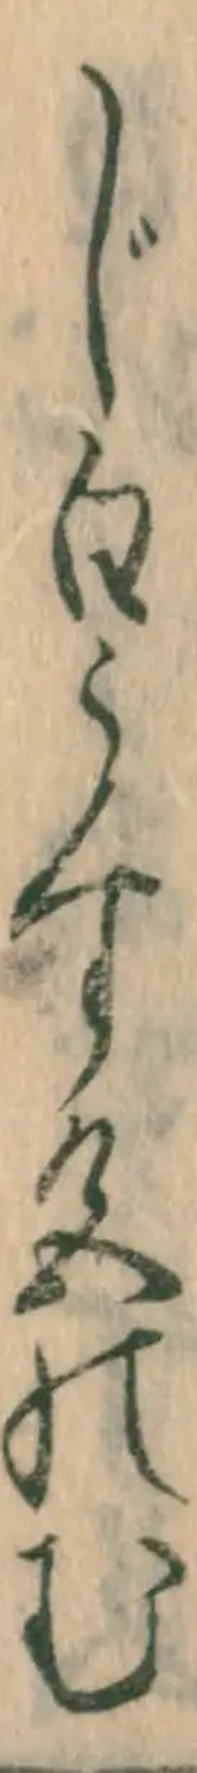じ白うす色のむ
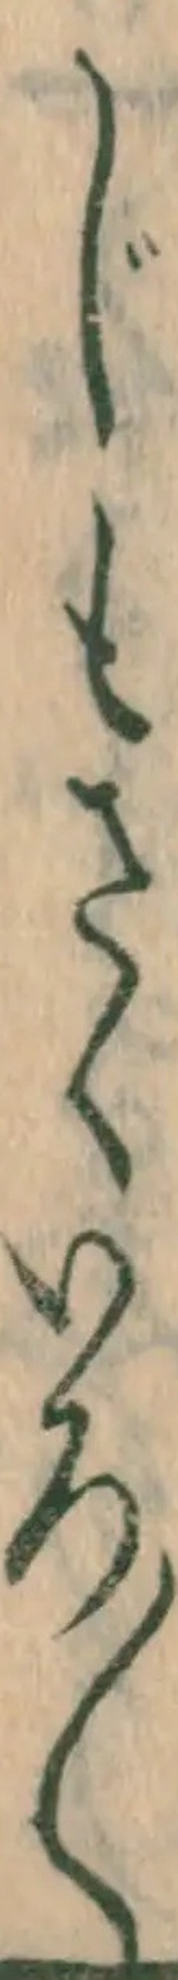じもさくいろ〳〵
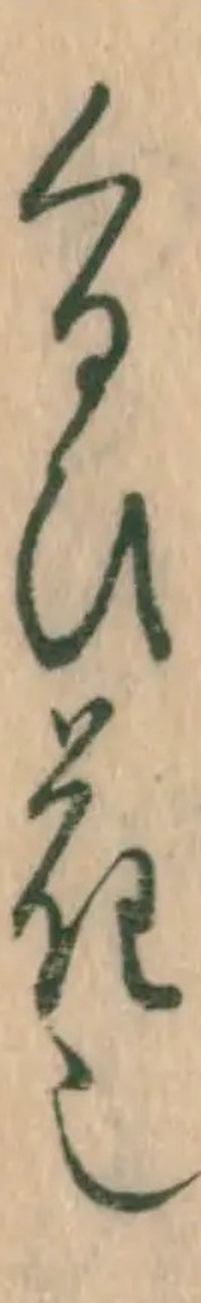くるひ花也
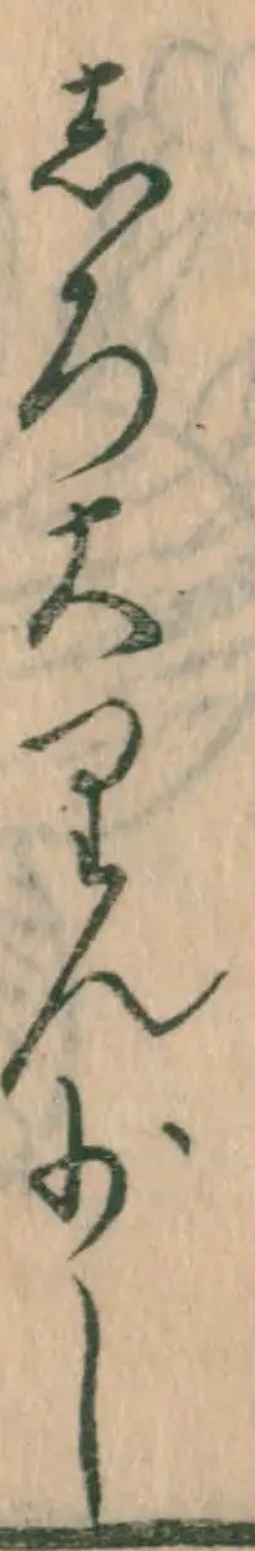しろ大りん少し
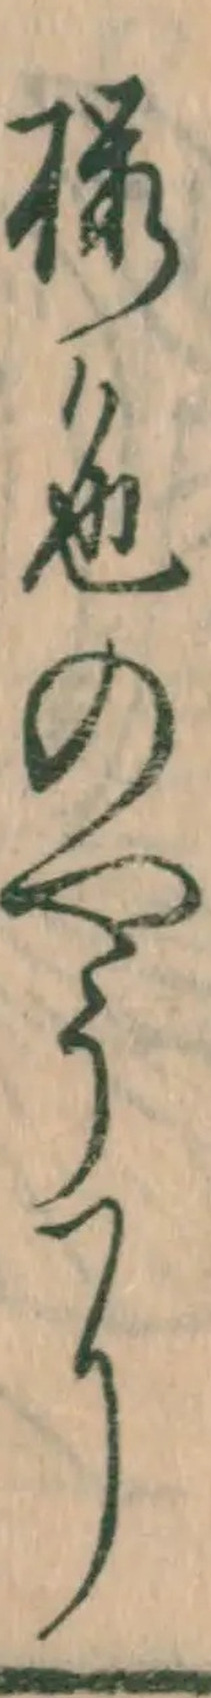桜色のやうに
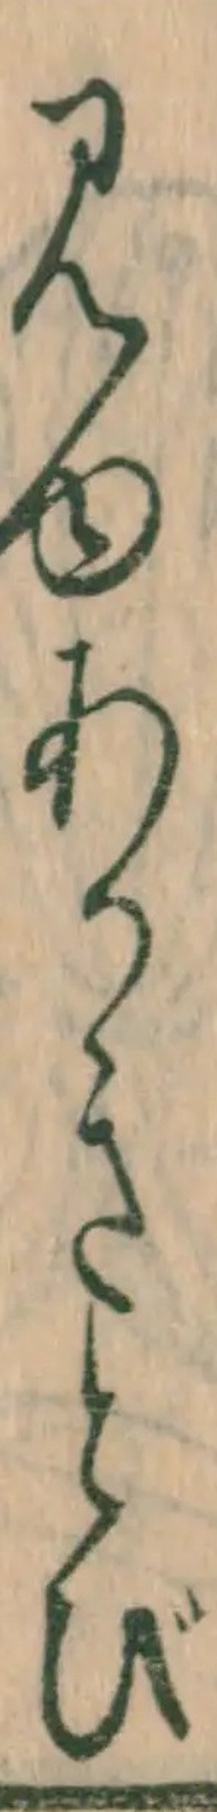見ゆあかきとび
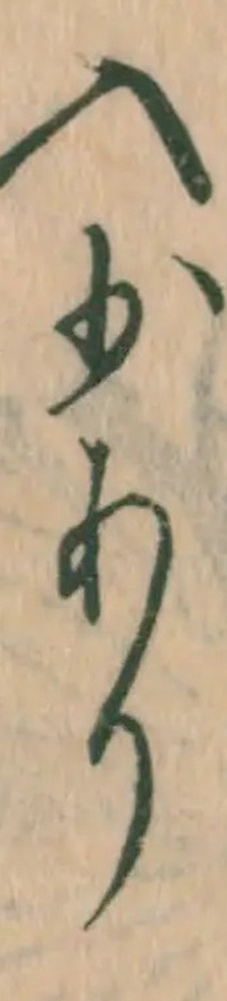入少あり
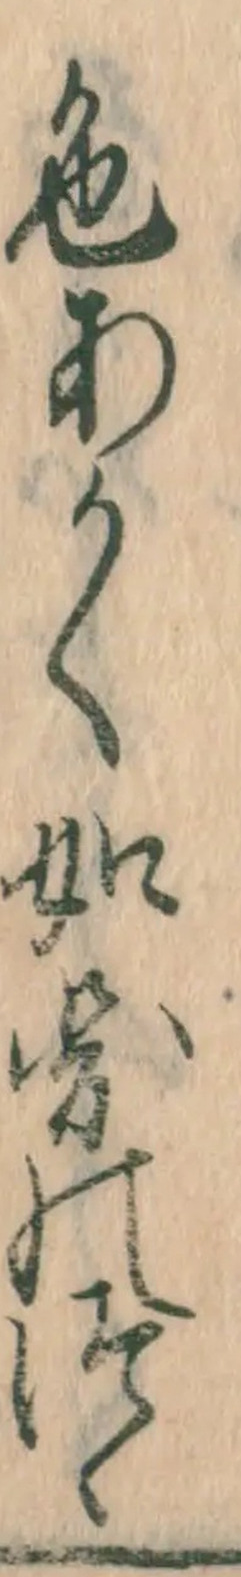色あかく如図のつゝ
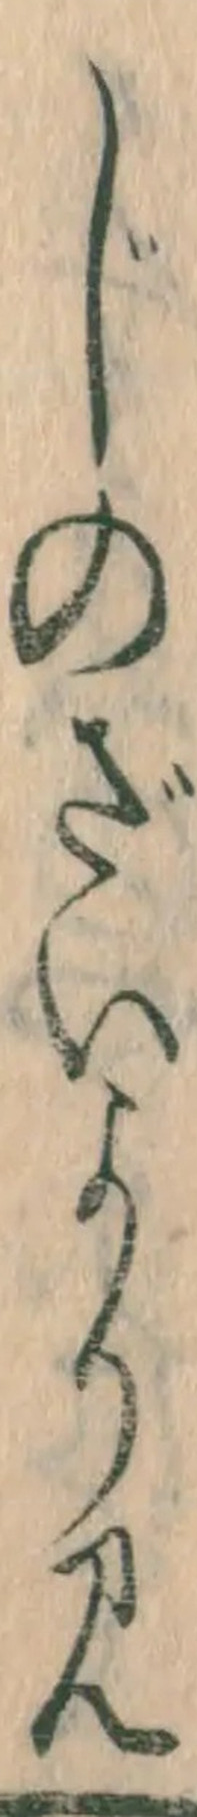じのざいよりみ
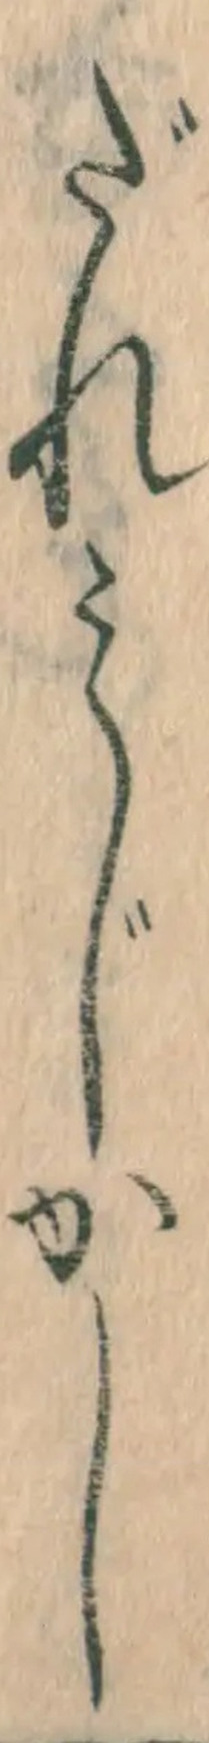だれみじかし

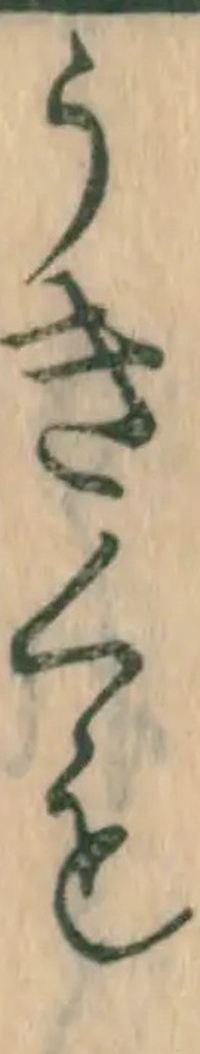うきくも
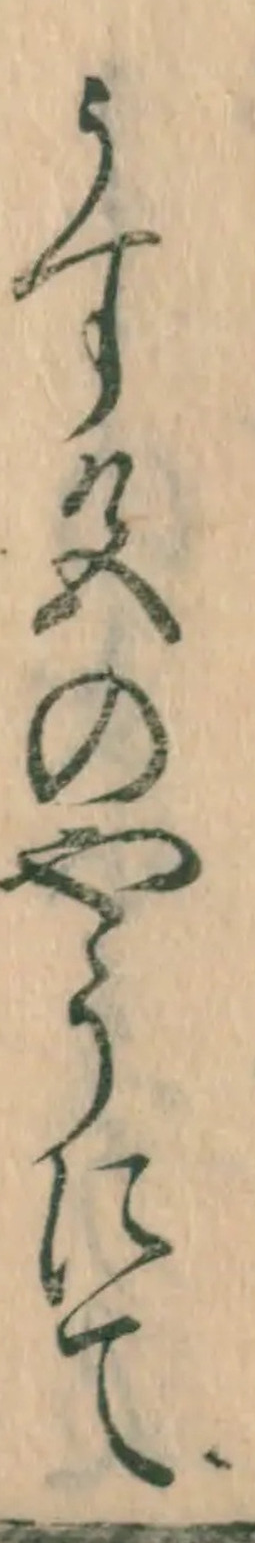うすいろのやうにて
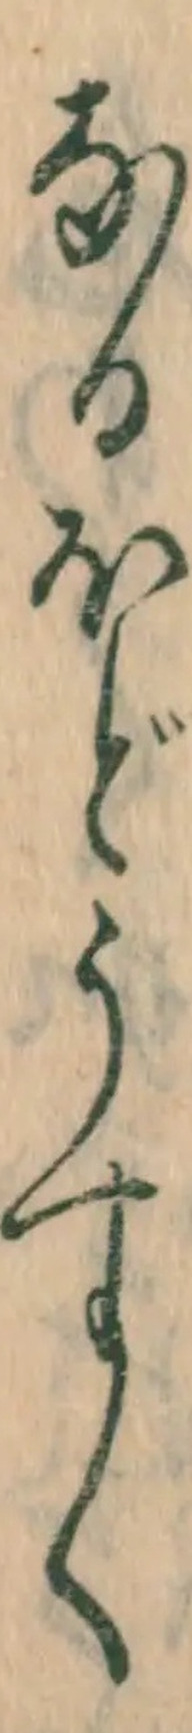なるほどうすく
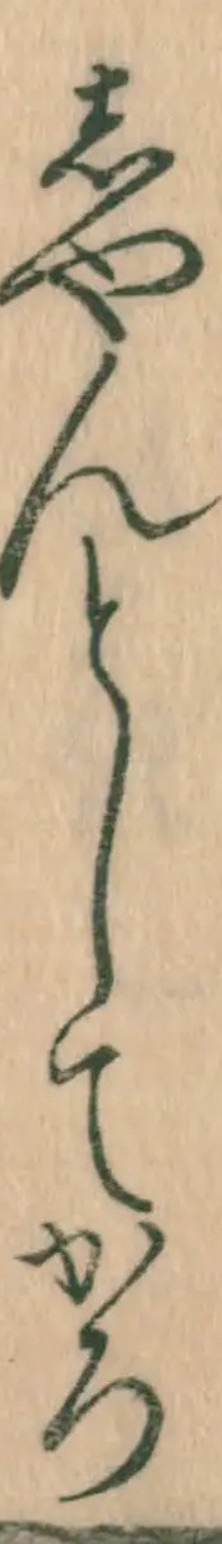しやんとしてかろ
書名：錦繍枕 5巻. [4]
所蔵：国立国会図書館 National Diet Library, JAPAN
